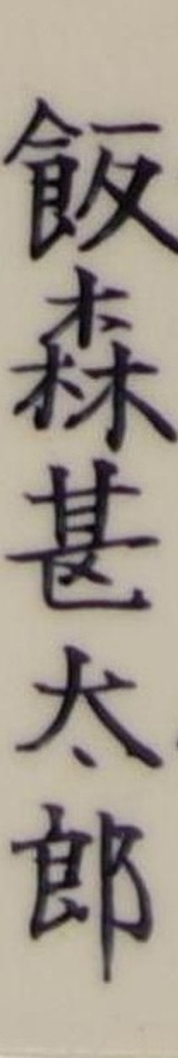飯森甚太郎
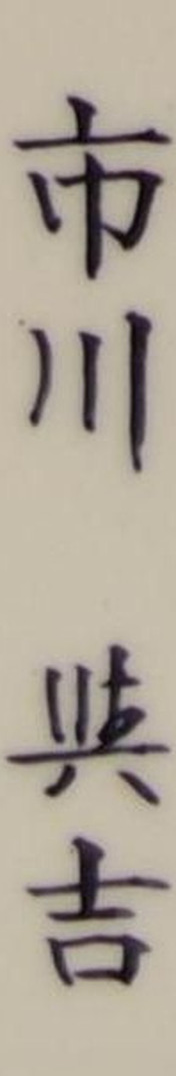市川與吉
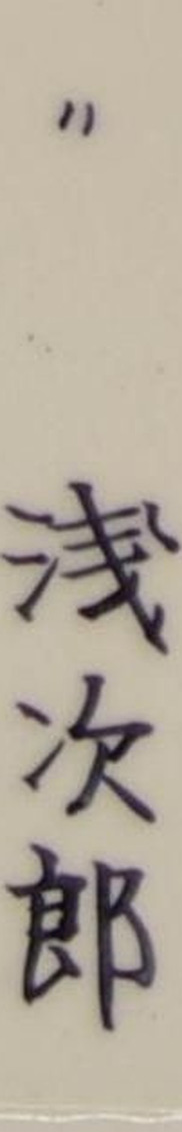浅次郎
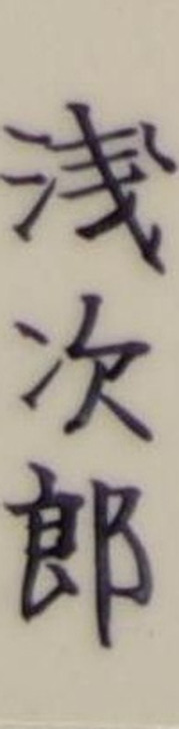浅次郎
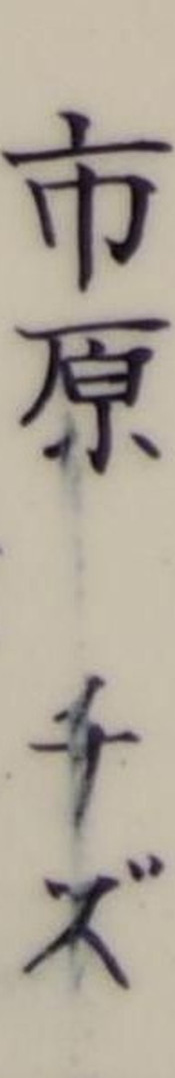市原チズ
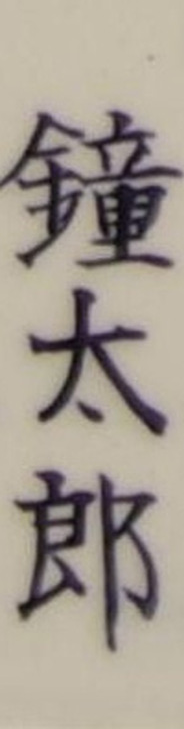鐘太郎
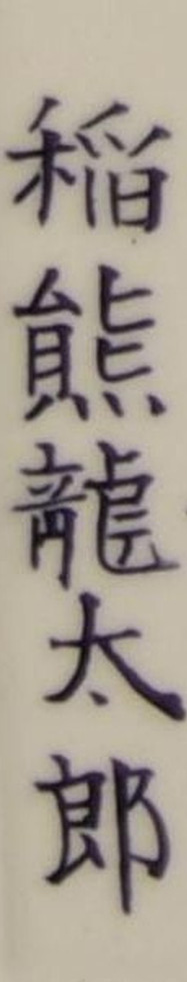稲熊龍太郎

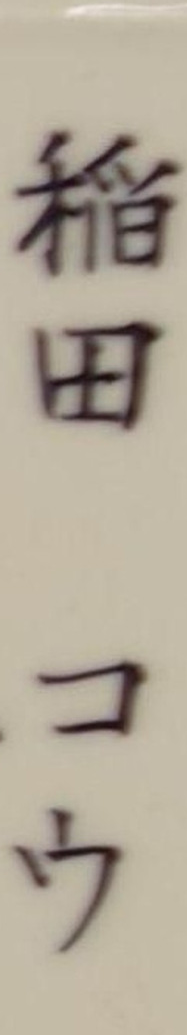稲田コウ
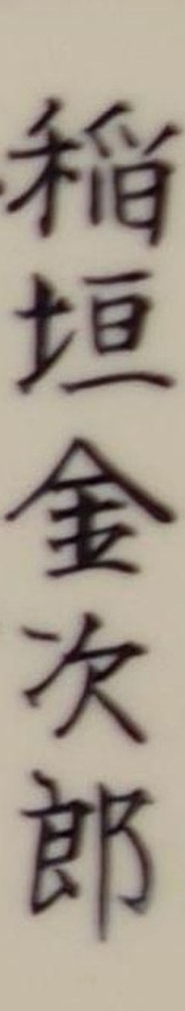稲垣金次郎
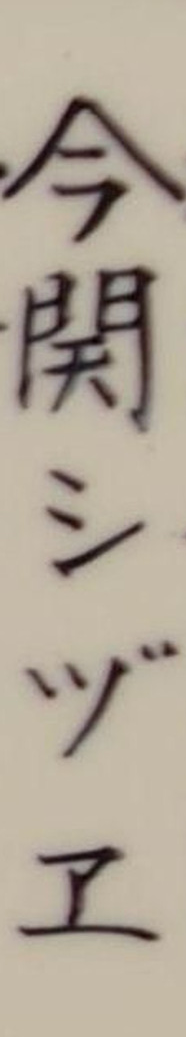今関シヅエ
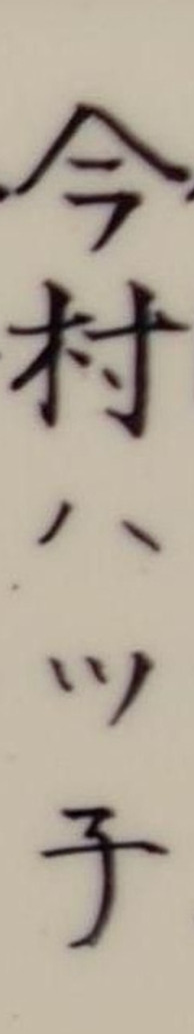今村ハツ子
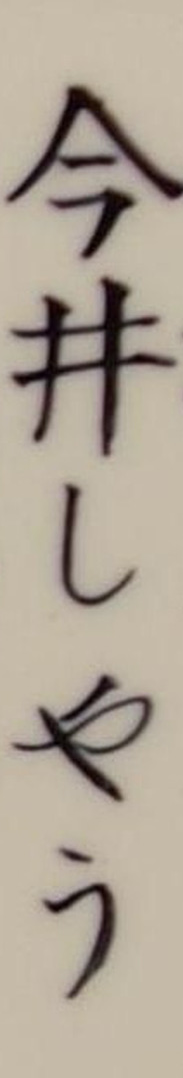今井しやう
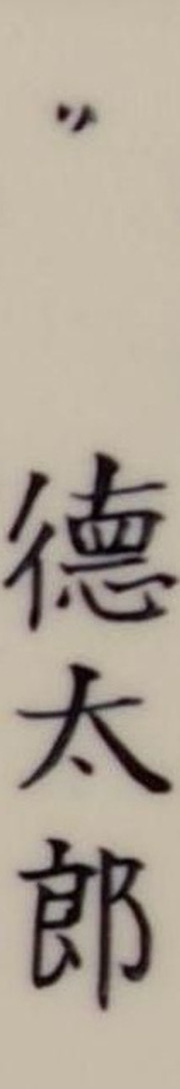徳太郎
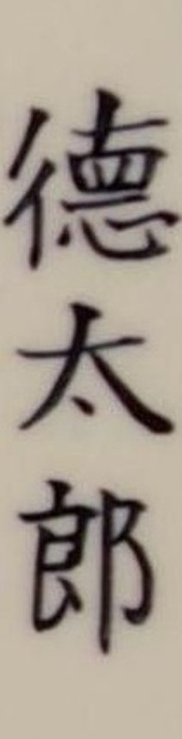徳太郎
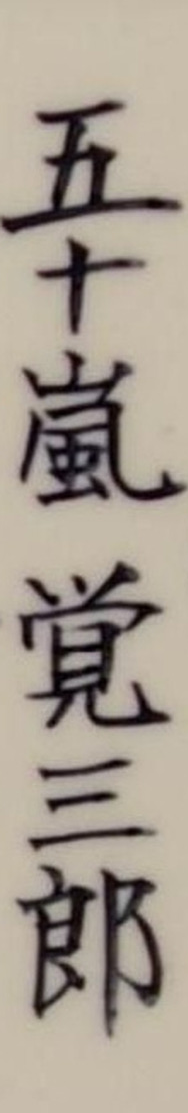五十嵐覚三郎
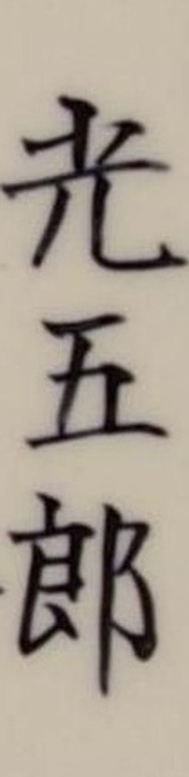光五郎
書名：M~S
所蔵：高野山金剛峯寺
